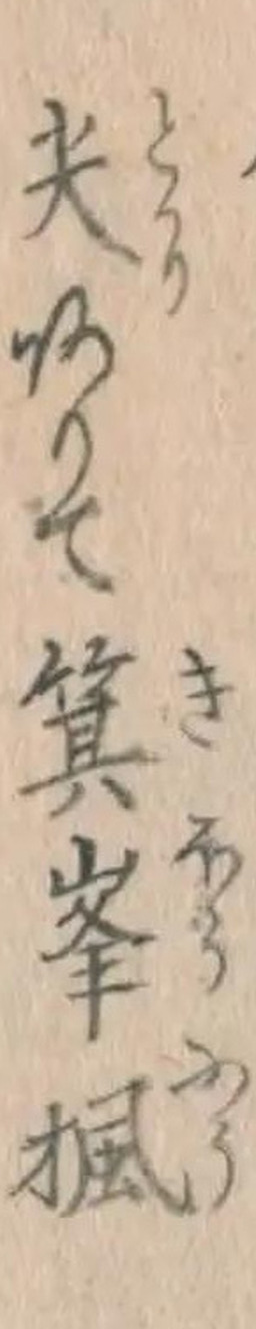尖ありて箕峯楓

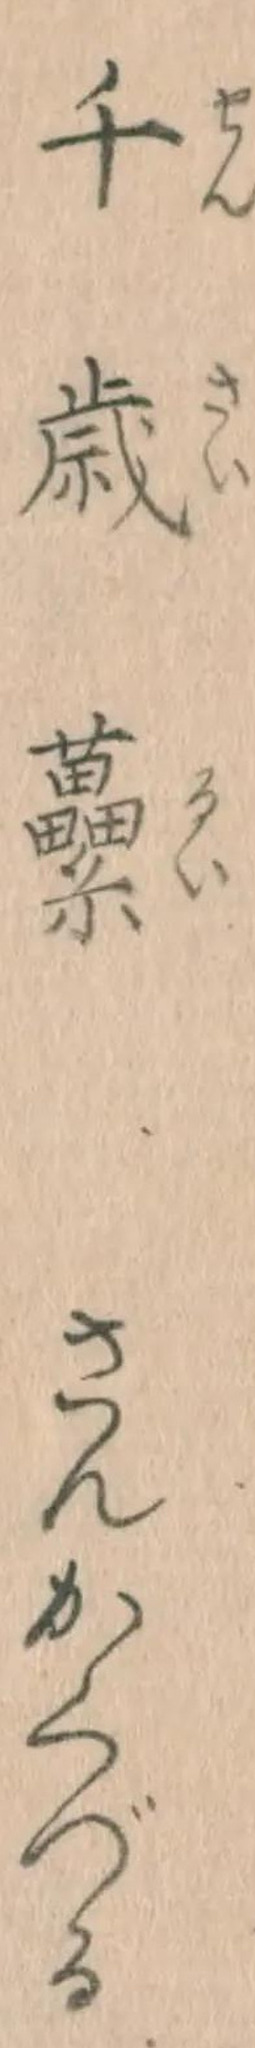千歳虆さんかくづる
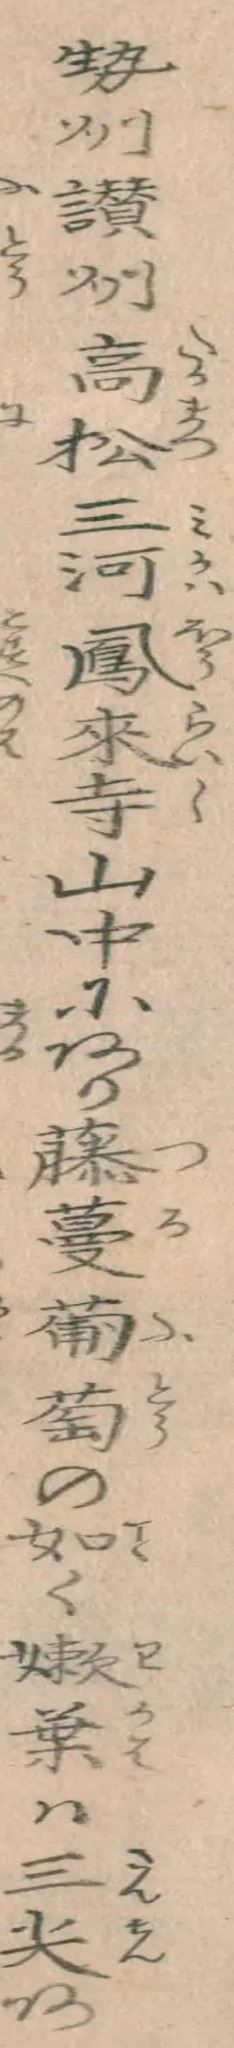勢州讃州高松三河鳳来寺山中にあり藤蔓葡萄の如く嫩葉は三尖あ
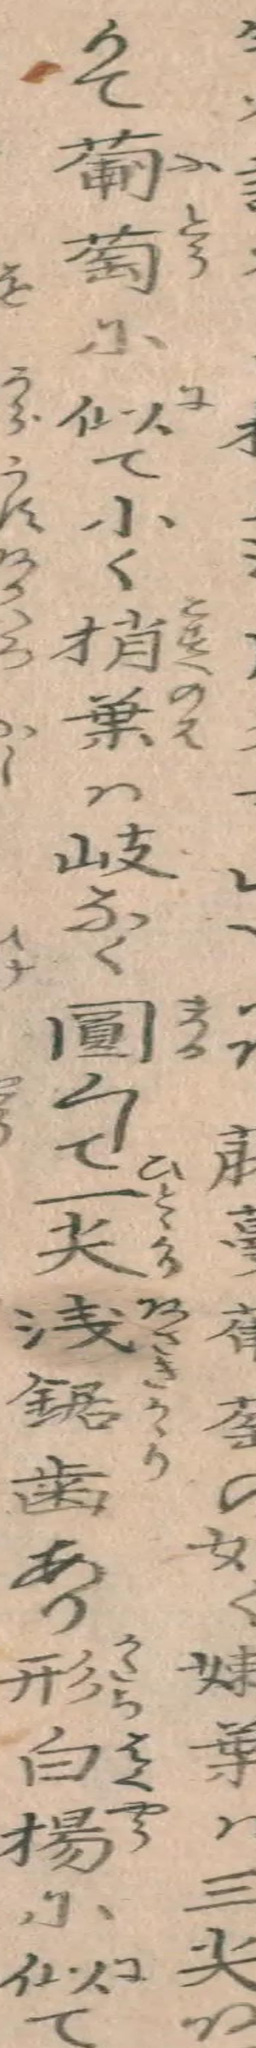りて葡萄に似て小く梢葉は岐なく円くして一尖浅鋸歯あり形白楊に似て
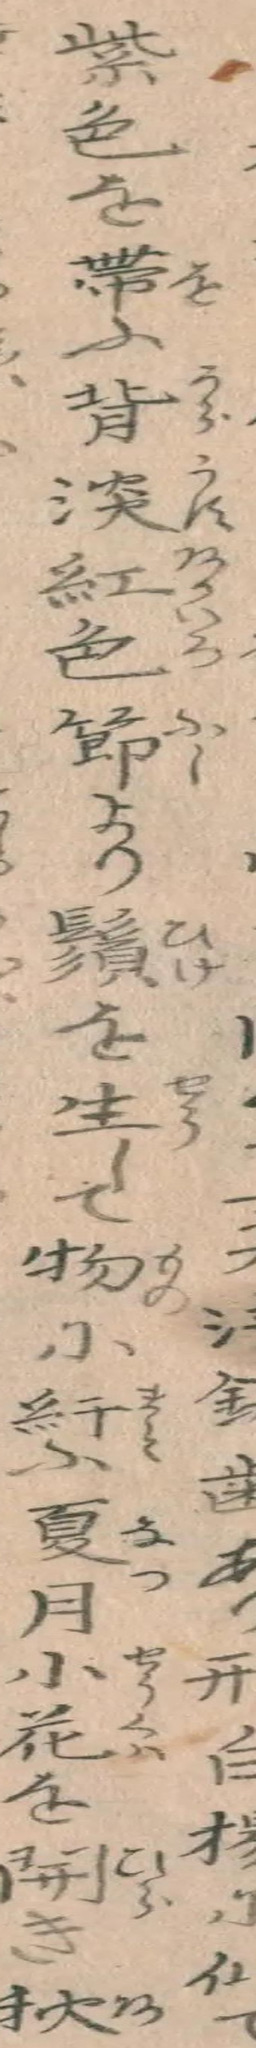紫色を帯ふ背淡紅色節より鬚を生して物に紆ふ夏月小花を開き秋
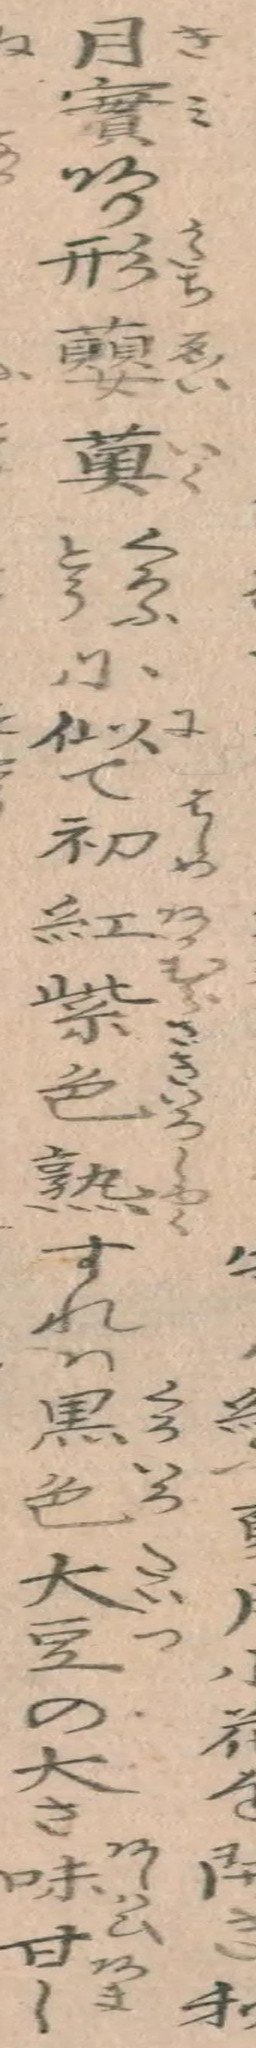月実あり形蘡薁くろふとうに似て初紅紫色熟すれは黒色大豆の大さ味甘し
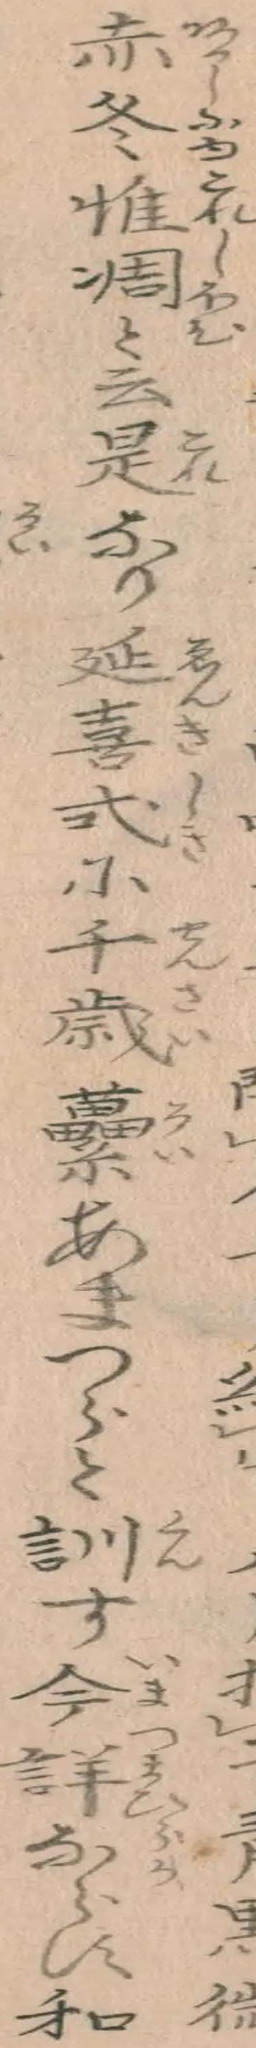赤冬惟凋と云是なり延喜式に千歳虆あまつらと訓す今詳ならす和
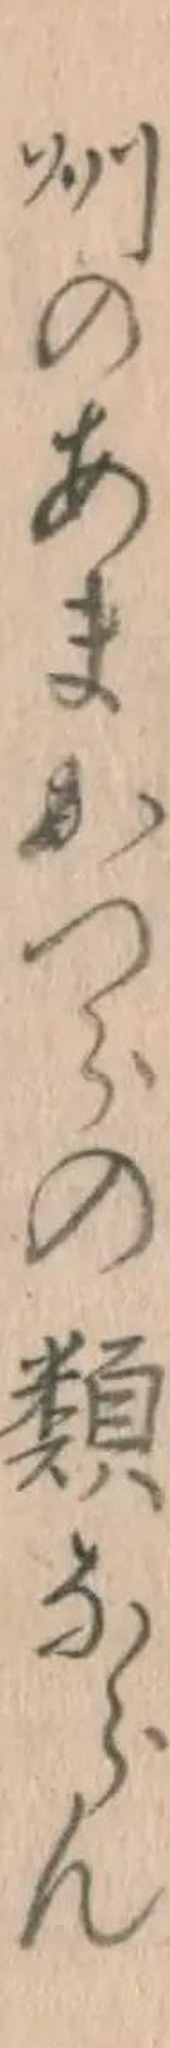州のあまかつらの類ならん
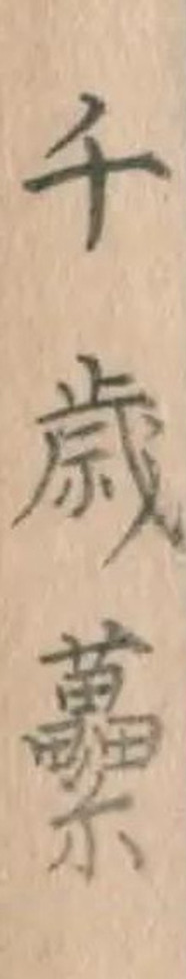千歳虆

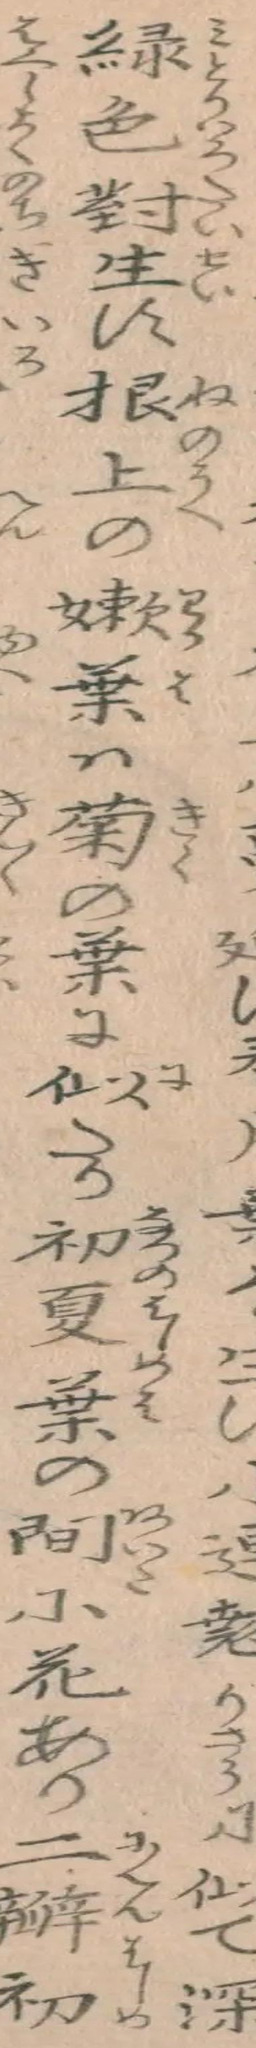緑色対生す根上の嫩葉は菊の葉に似たり初夏葉の間に花あり二弁初
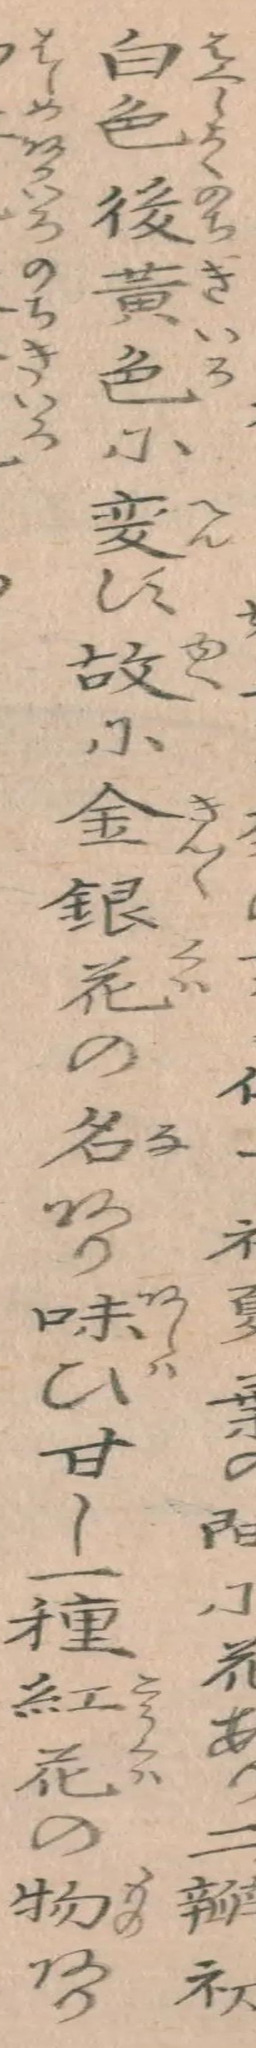白色後黄色に変す故に金銀花の名あり味ひ甘し一種紅花の物あり
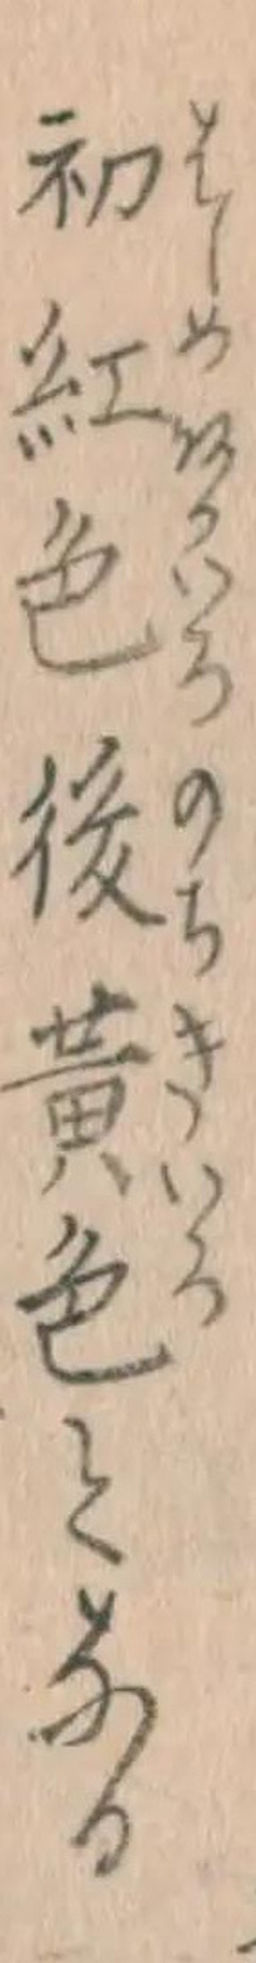初紅色後黄色となる
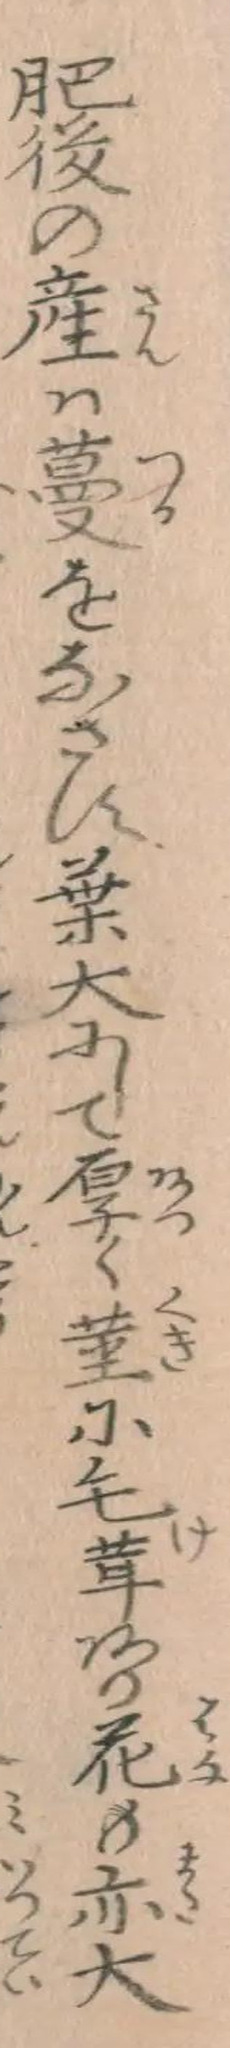肥後の産は蔓をなさす葉大にして厚く茎に毛茸あり花も亦大
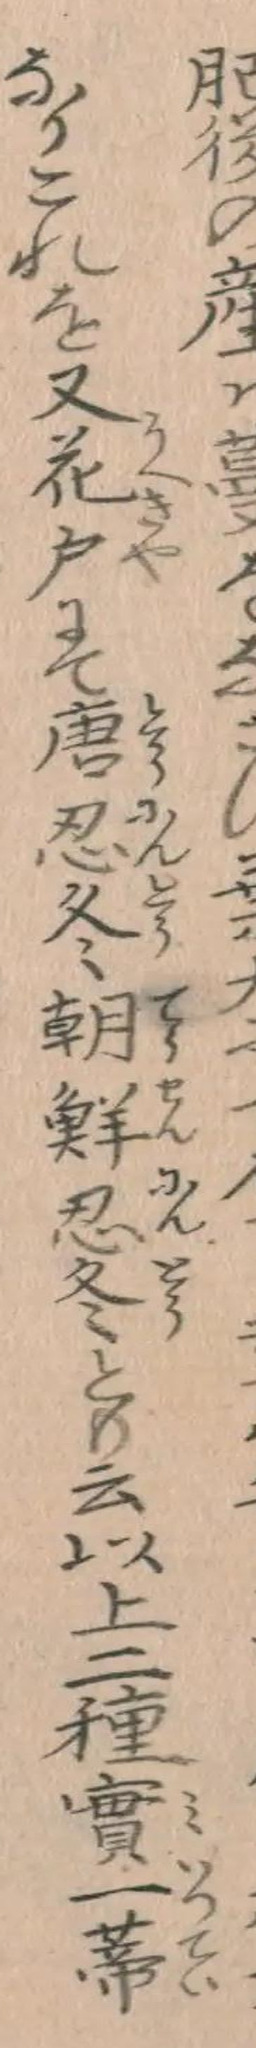なりこれを又花戸にて唐忍冬朝鮮忍冬とも云以上二種実一蒂
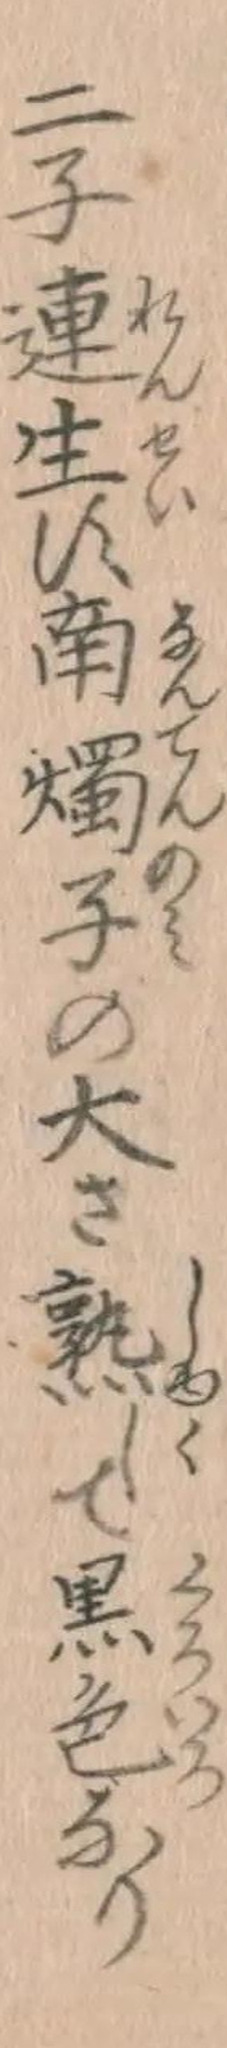二子連生す南燭子の大さ熟して黒色なり

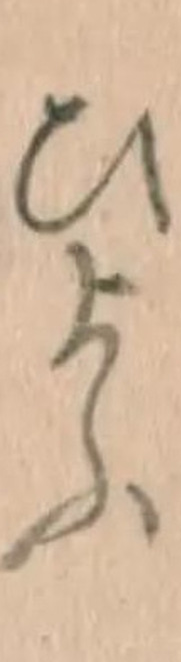ひよふ
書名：本草図譜. 巻31-33
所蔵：国立国会図書館 National Diet Library, JAPAN
